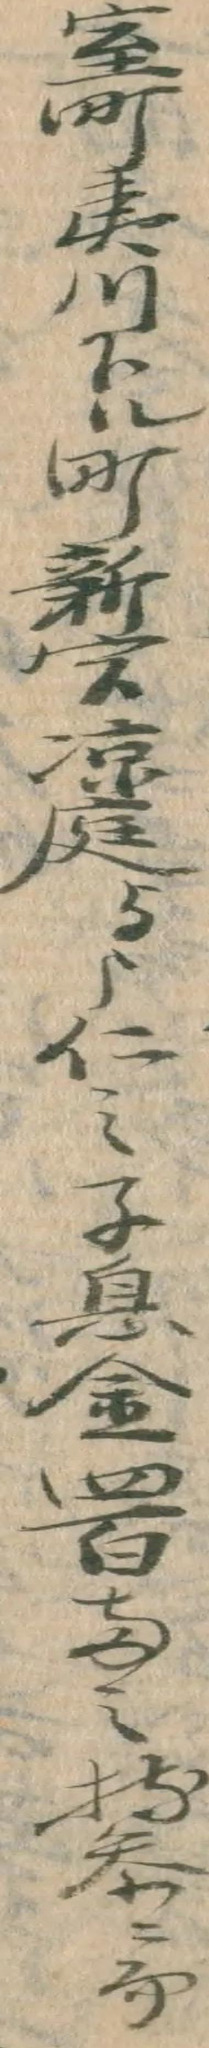室町夷川下ル町新宮涼庭と申仁之子息金四百両之持参ニ而
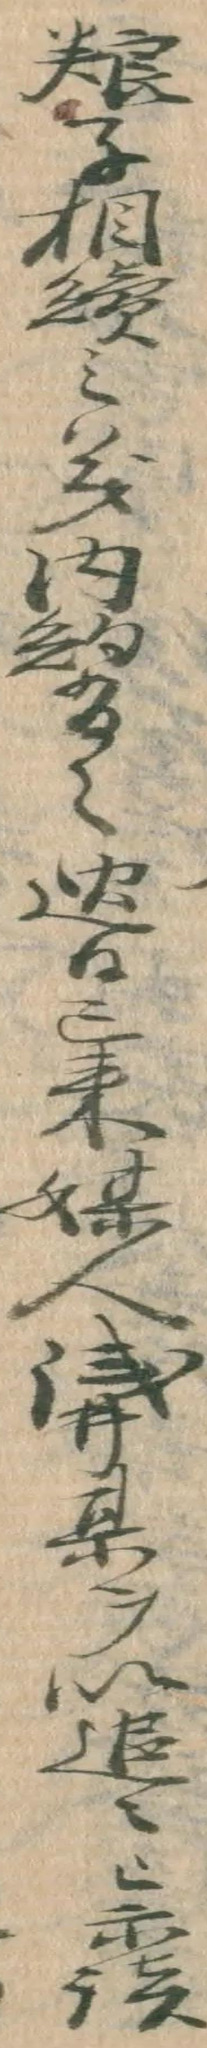羪子相続之義内約有之過日已来媒人浅井某ヲ以追々被示談
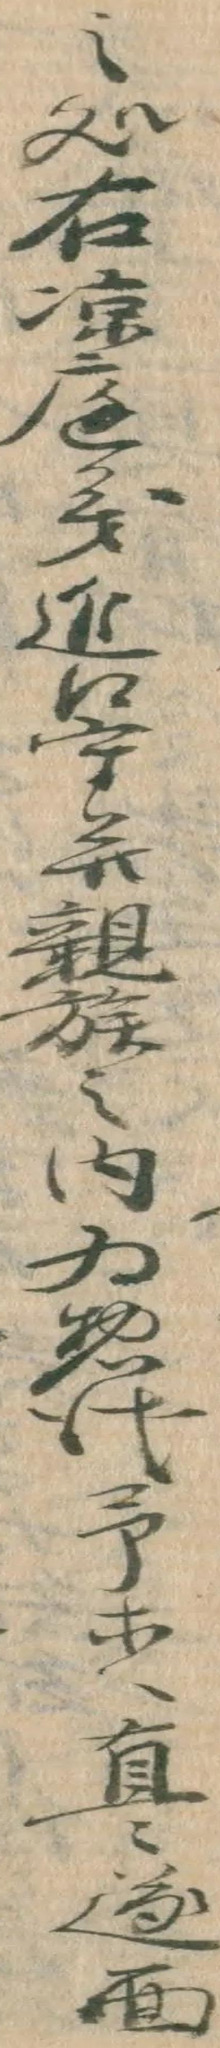之処右涼庭義近江守并親族之内為惣代予等へ直々遂面
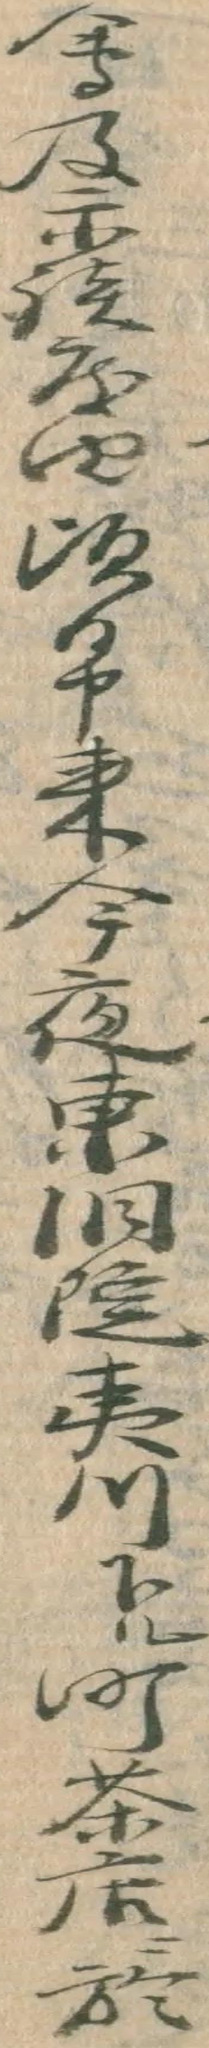會及示談度由頃日申来今夜東洞院夷川下ル町茶店ニ於
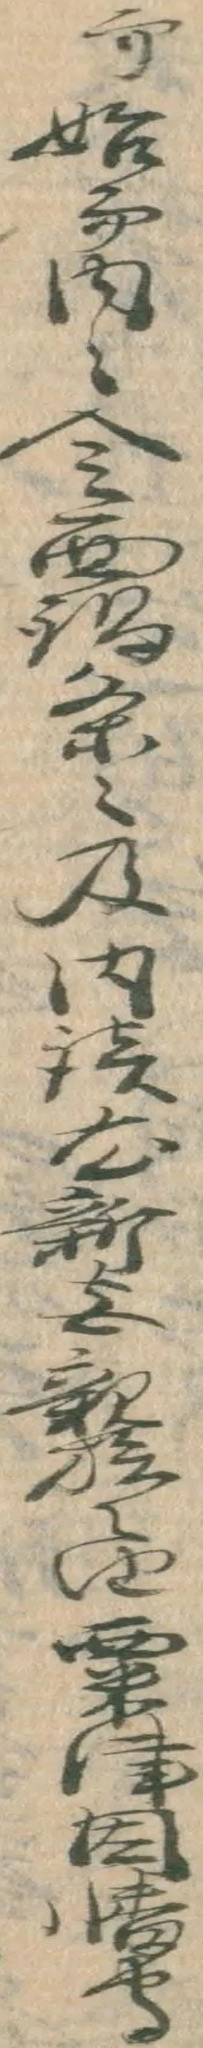而始而内々人令面約条々及内談尤新宮親族之由粟津因幡守
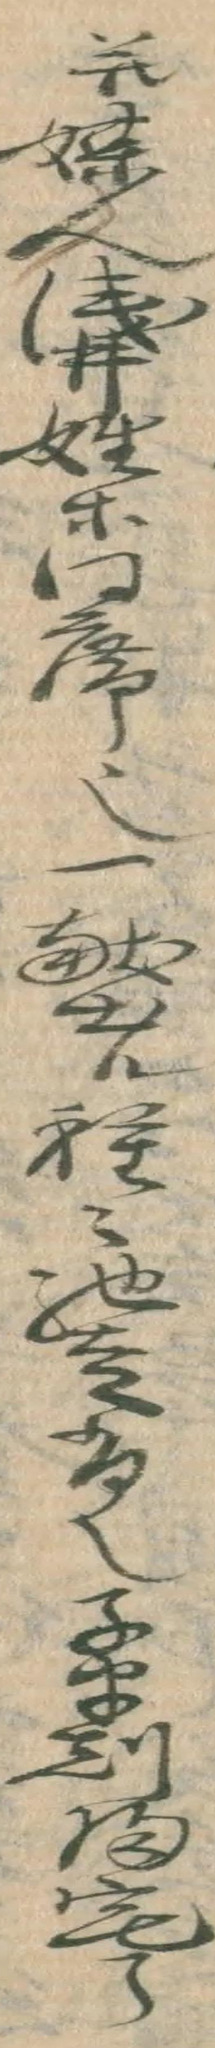幷煉物浅井姓等同席也一献出ル種々馳走有之子半刻帰宅了
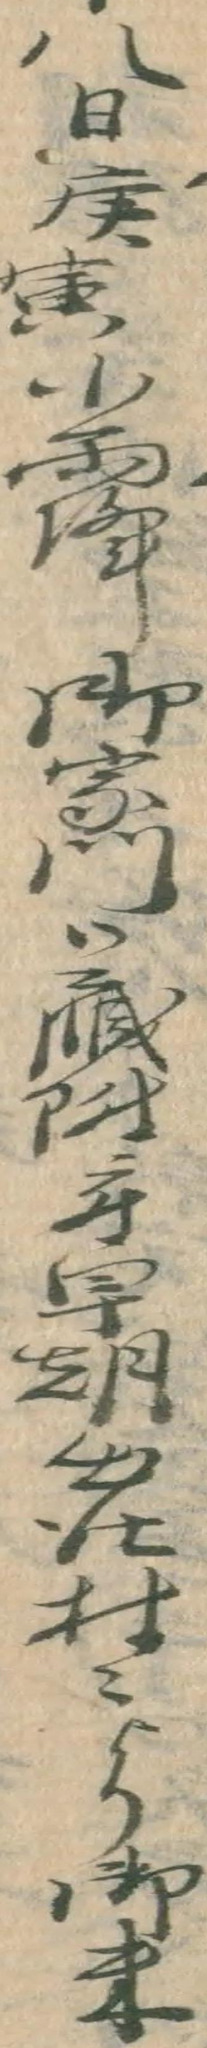十八日庚寅小雨降御家門御蔵附ニ付早朝出仕村々より御米
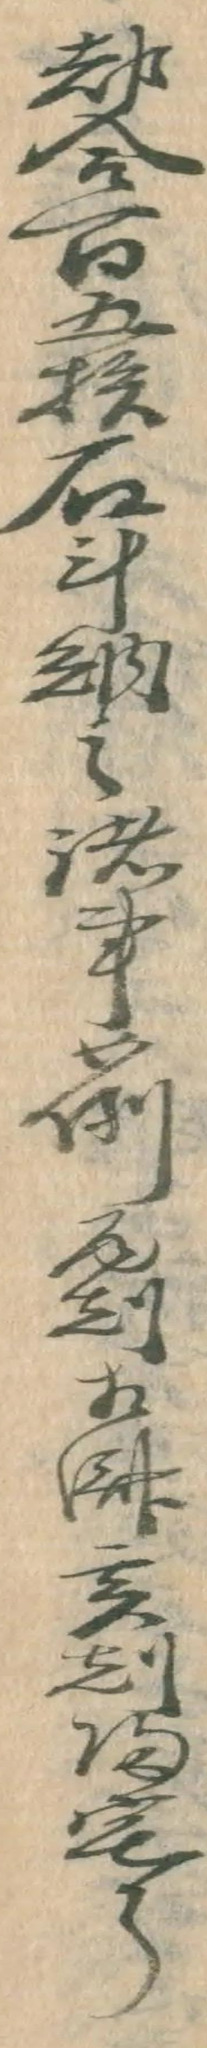都合百五拾石計納之諸事如例酉刻相済亥刻帰宅了

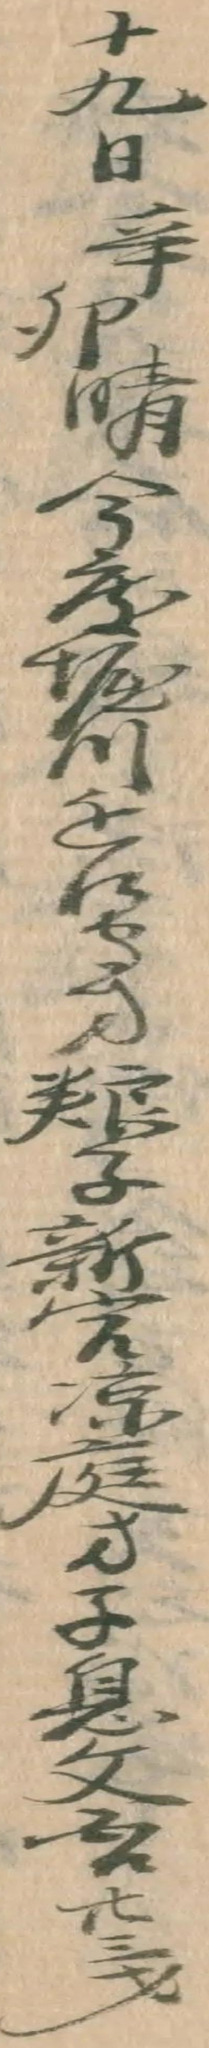十九日辛卯晴今度堀川近江守方養子新宮涼庭方子息文吾廿三才
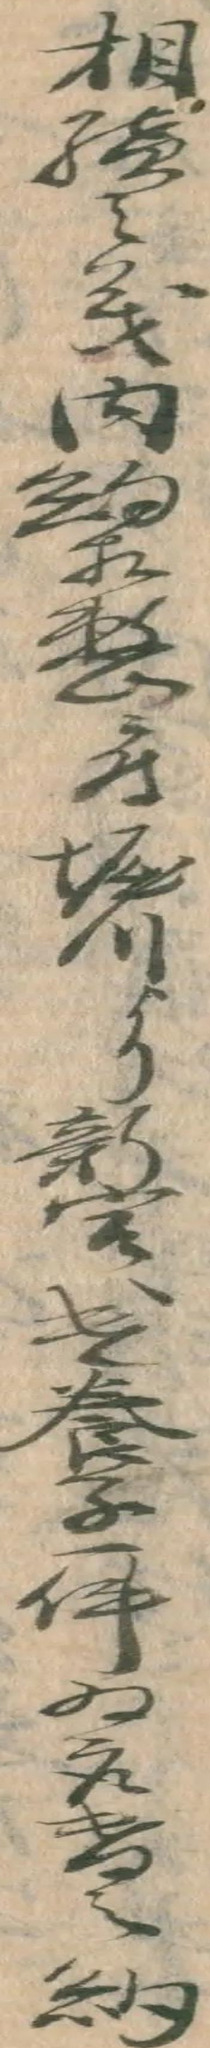相續之義内約相整ニ付堀川より新宮へ遣養子一件為取之納
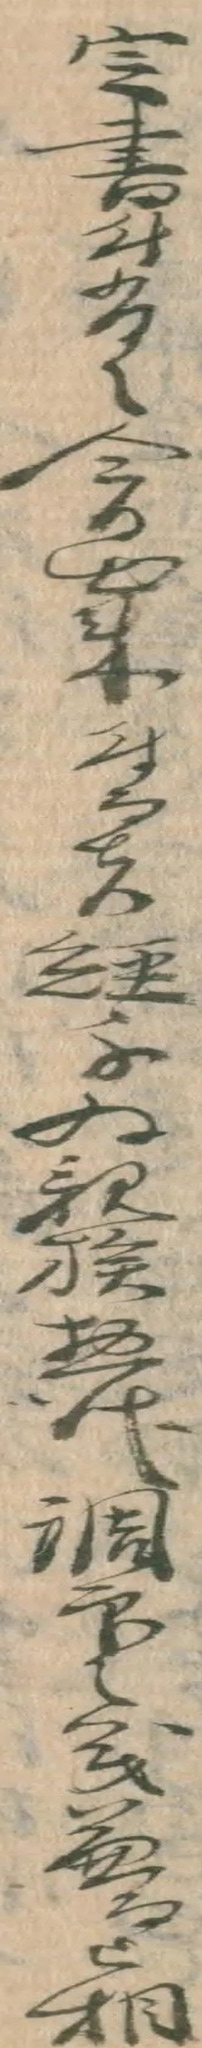定書付有之今日出来付而者経子為親族惣代調印之義兼而被相
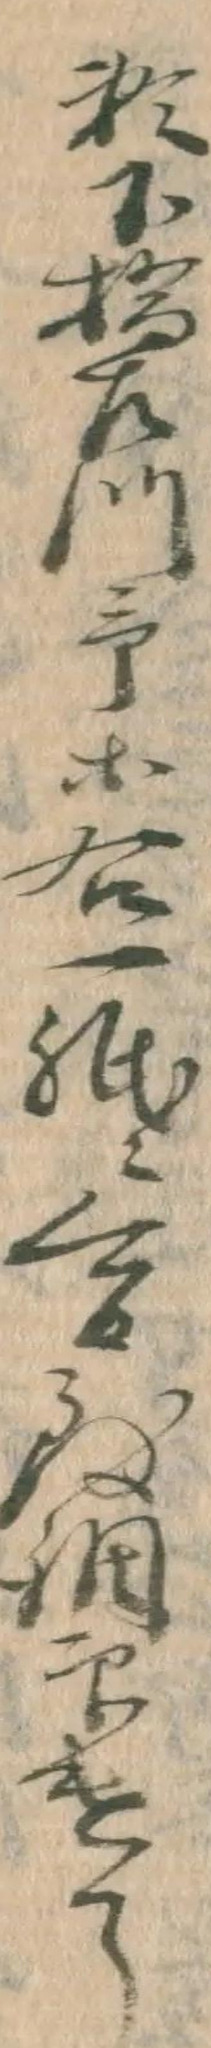頼下橋左門予等右一紙に今日致調印遣候
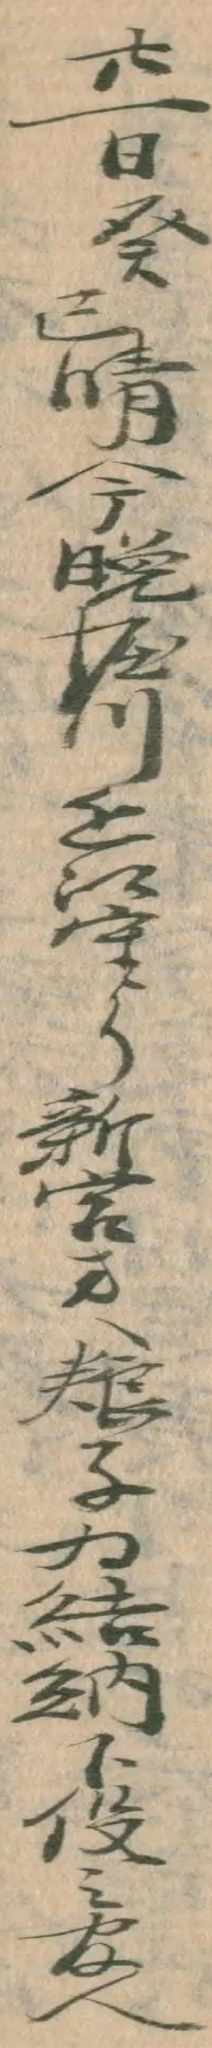廿一日癸巳晴今暁堀川近江守より新宮方へ養子為結納候役之官人
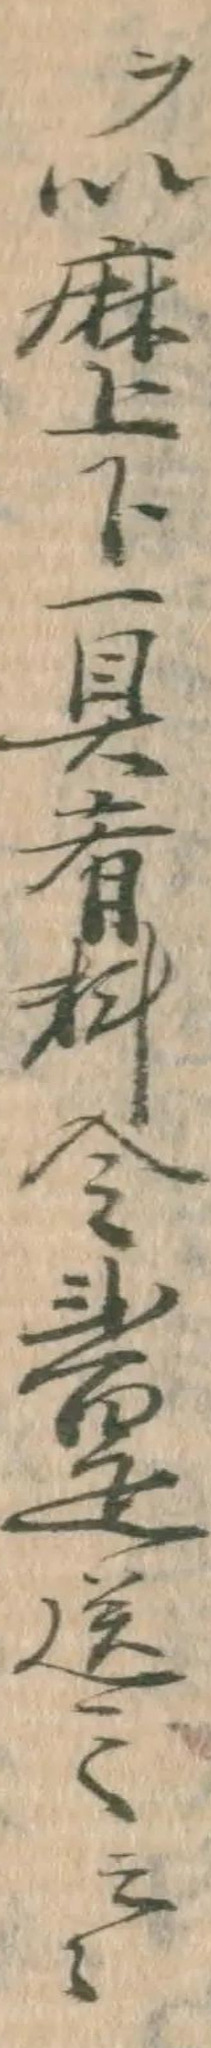ヲ以麻上下一具肴料金弐百疋送之云々
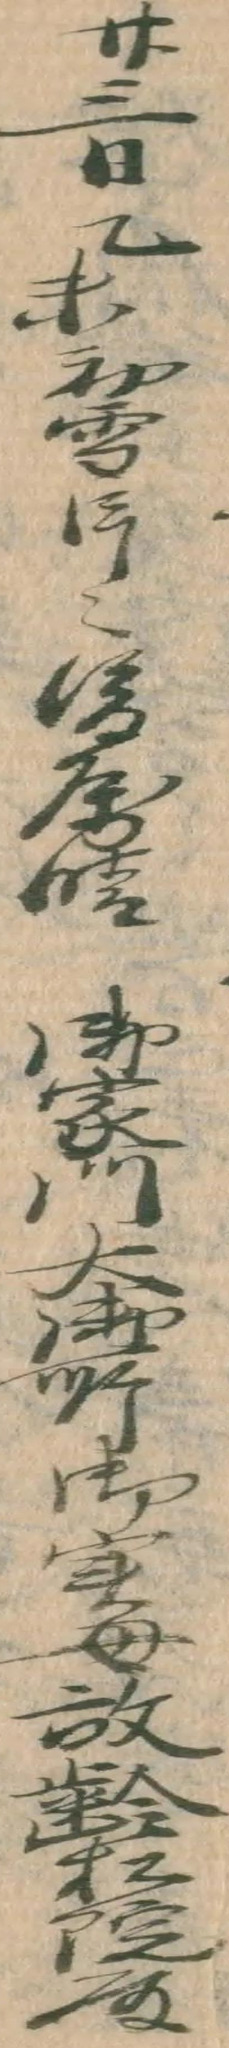廿三日乙未初雪片之後属晴御家門大御所御実母放齢於院殿
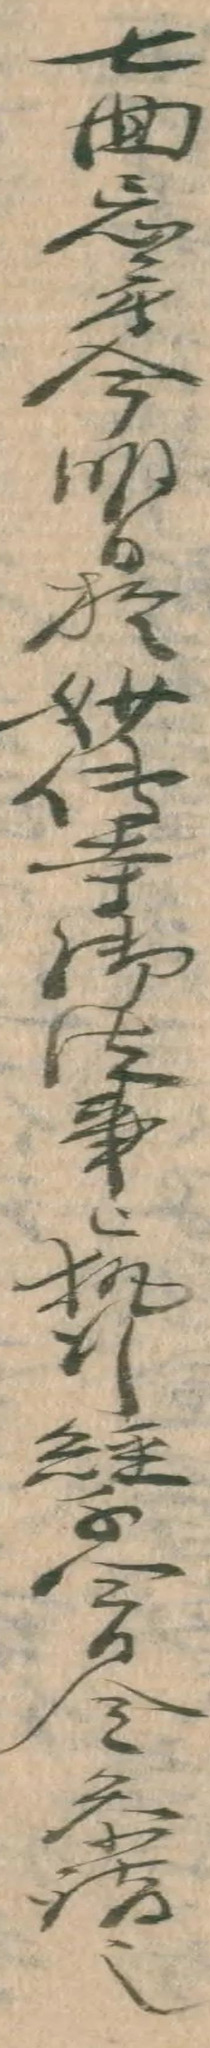七回忌ニ付今明日於妙傳寺御法事被執行経千今日令参詣也
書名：賀茂社記録. 第65冊
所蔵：国立国会図書館 National Diet Library, JAPAN
